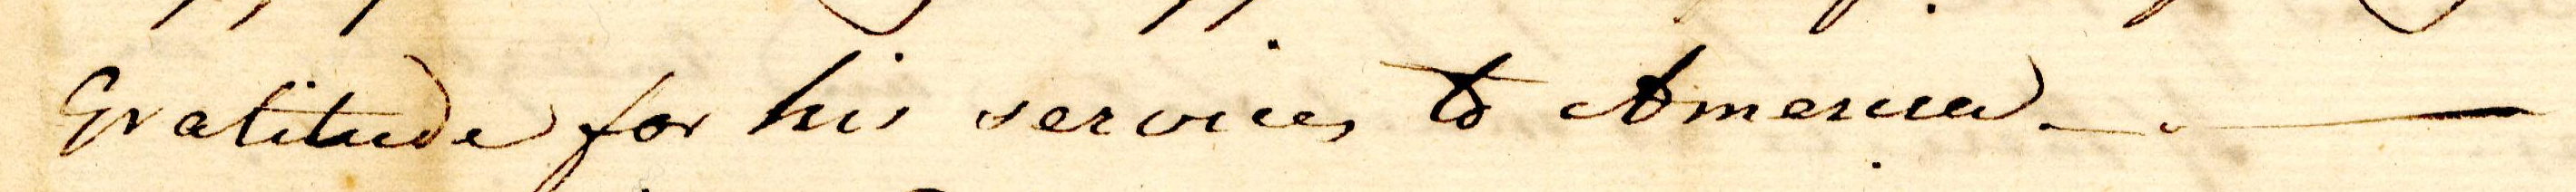Gratitude for his service to America.-
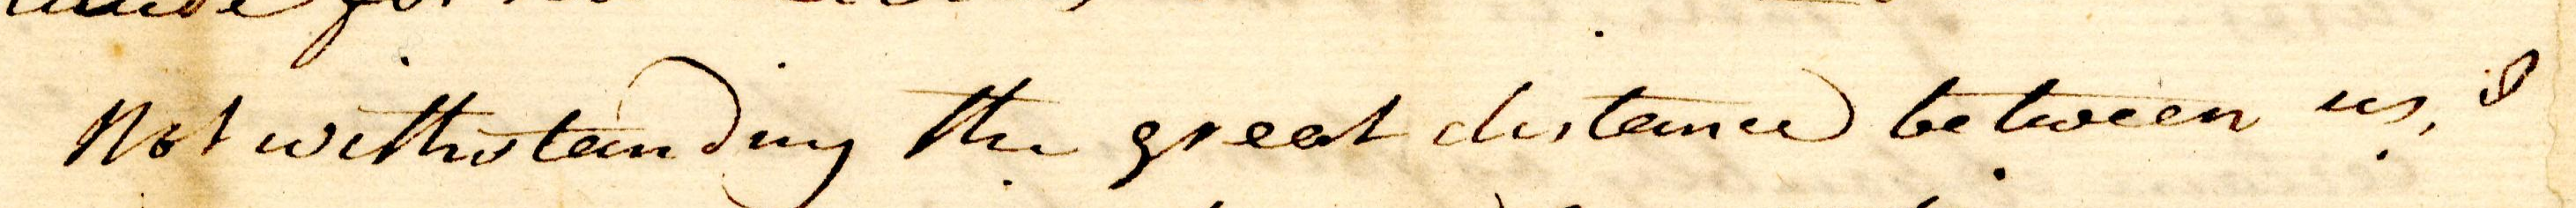Not withstanding the great distance between us, I
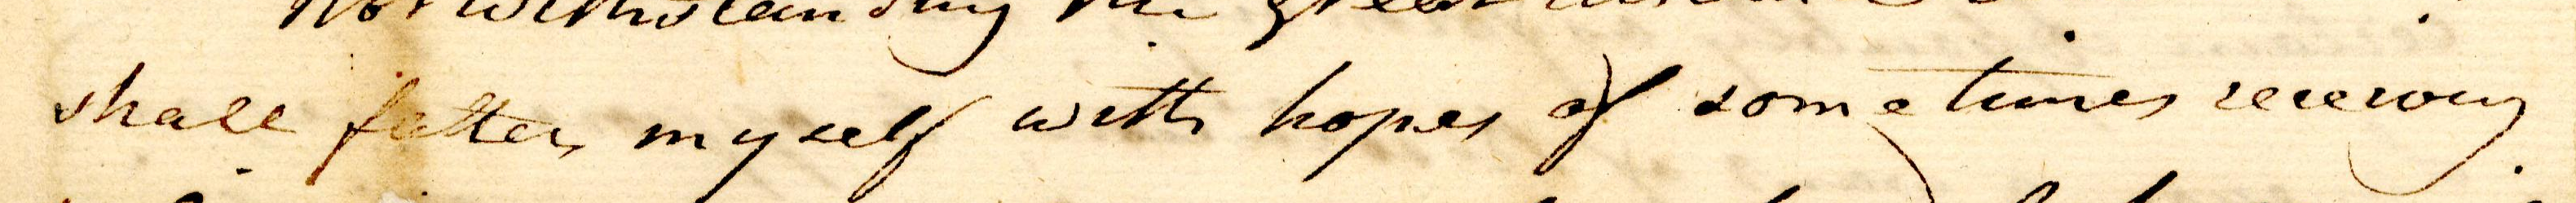shall falter myself with hopes of sometimes receiving
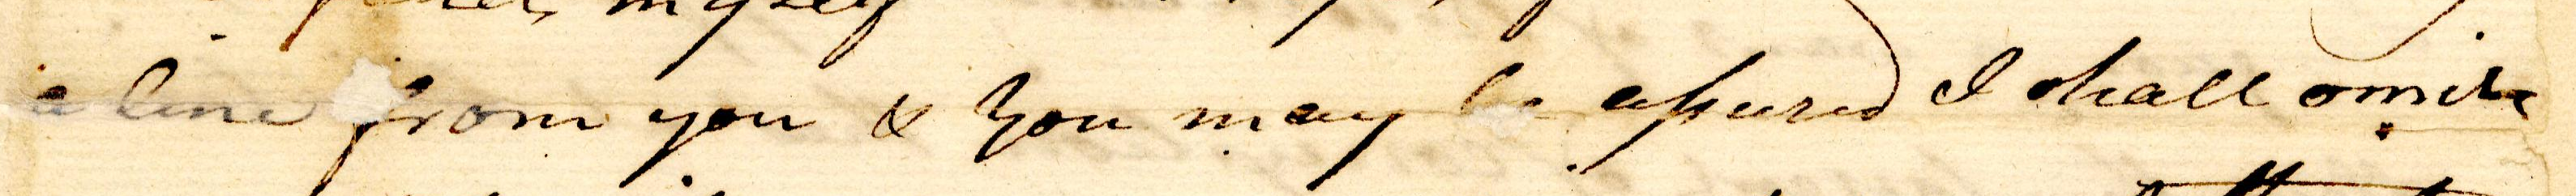a line from you & you may be assured I shall omit
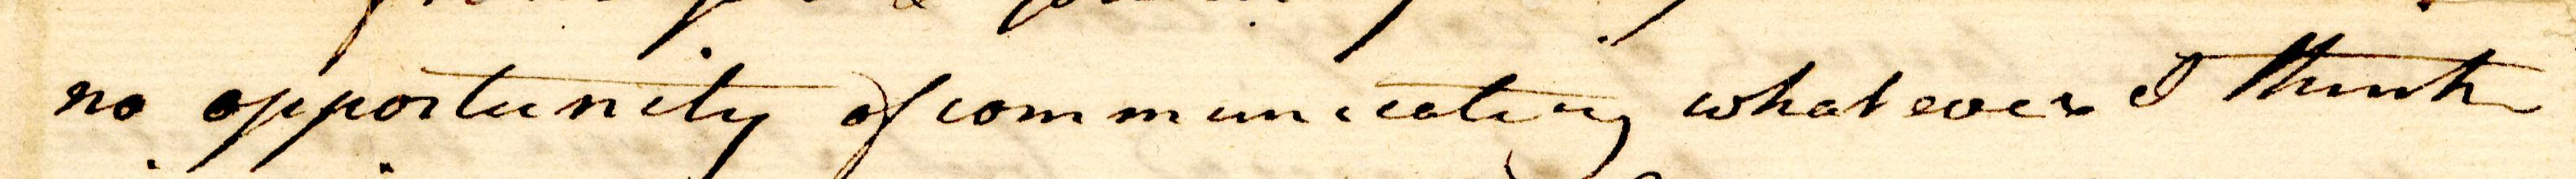no opportunity of communicating what ever I think
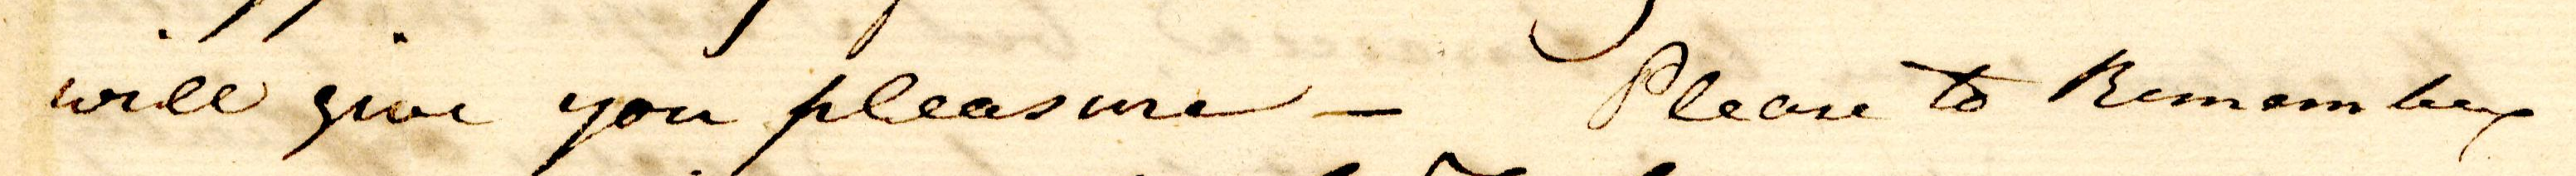will give you pleasure- Please to Remember
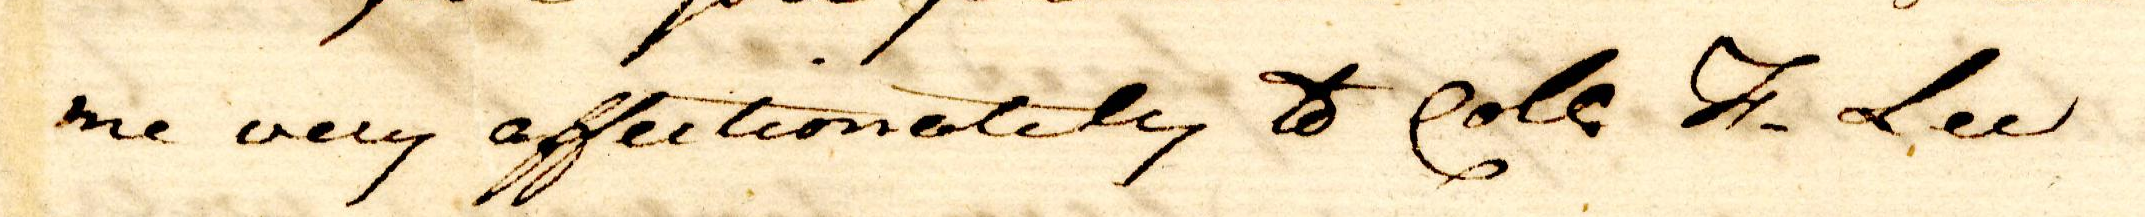me very affectionately to Colo H. Lee
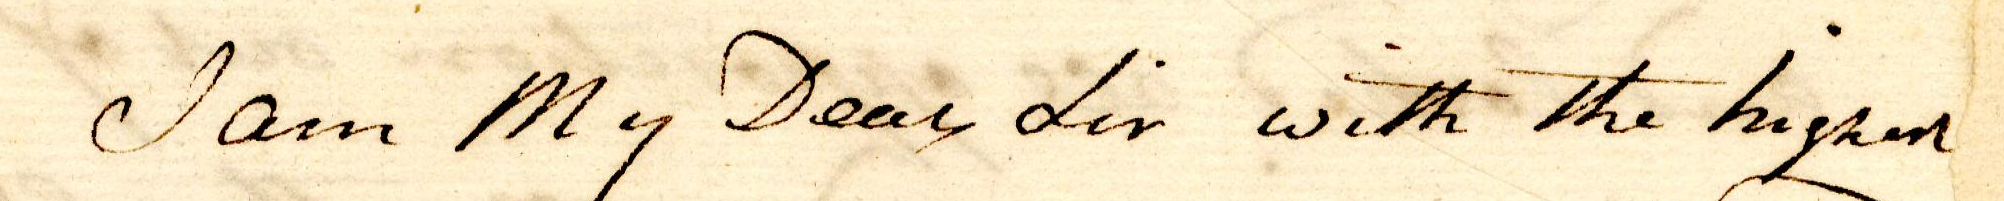I am My Dear Sir with the highest
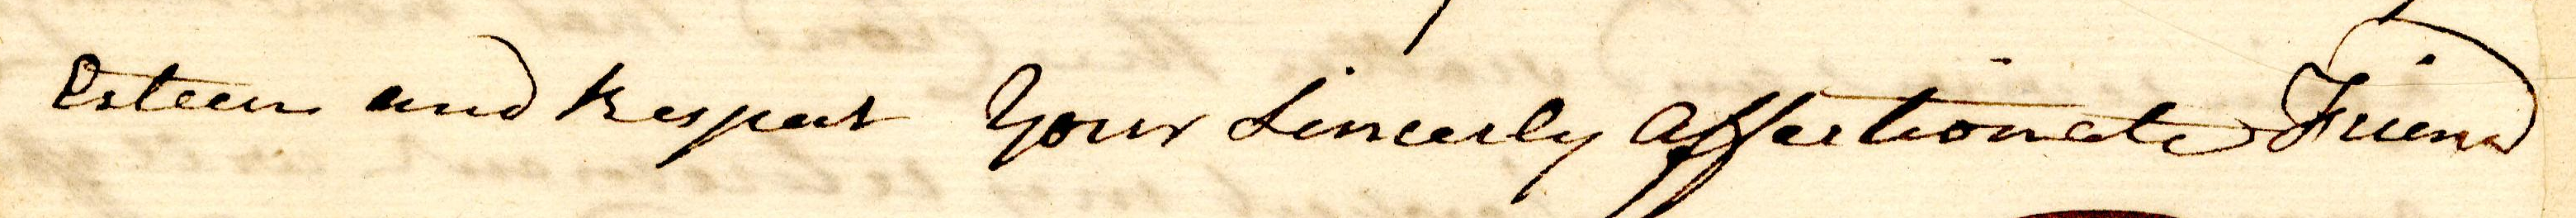Esteen and Respect Your Sincerly affectionate Friend
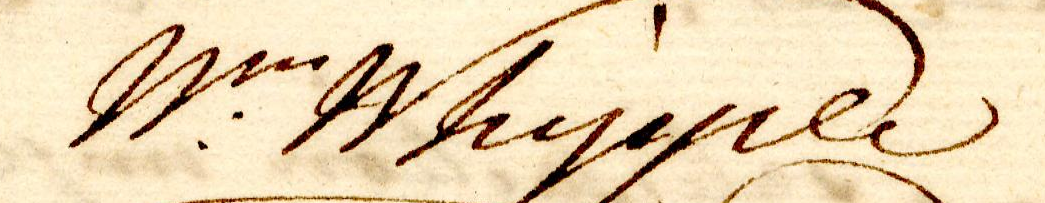W^m: Whipple
